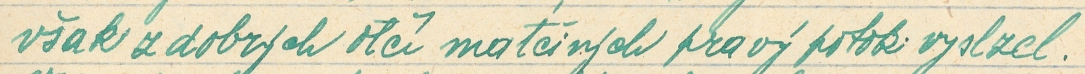však z dobrých otčí matčiných pravý potok vyslzel.
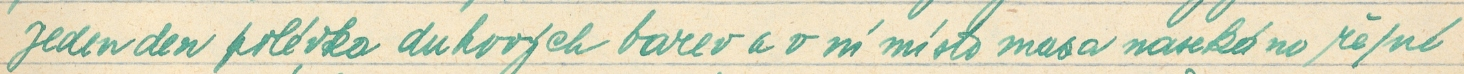Jeden den polévka duhových barev a v ní místo masa nasekáno řepné
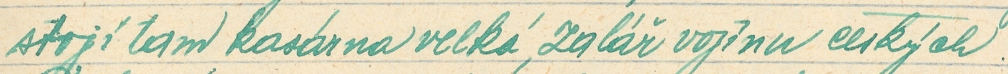stojí tam kasárna velká, zalář vojínu českých.
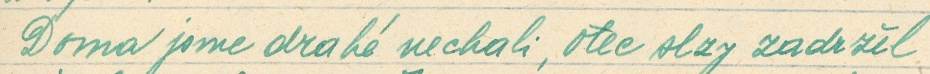Doma jsme drahé nechali, otec slzy zadržel
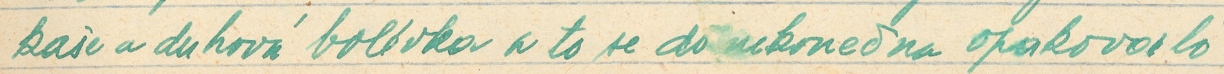kaše a duhová bolévka a to se do nekonečna opakovalo.
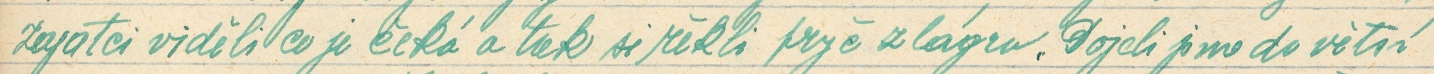zajatci viděli co je čeká a tak si řekli pryč z lágru. Dojeli jsme do větší
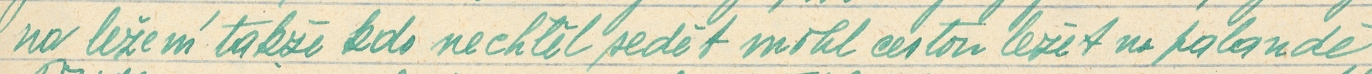na ležení takže kdo nechtěl sedět mohl cestou ležet na palandě.
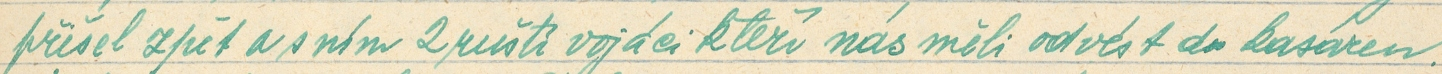přišel zpět a s ním 2 ruští vojáci kteří nás měli odvést do kasáren.
